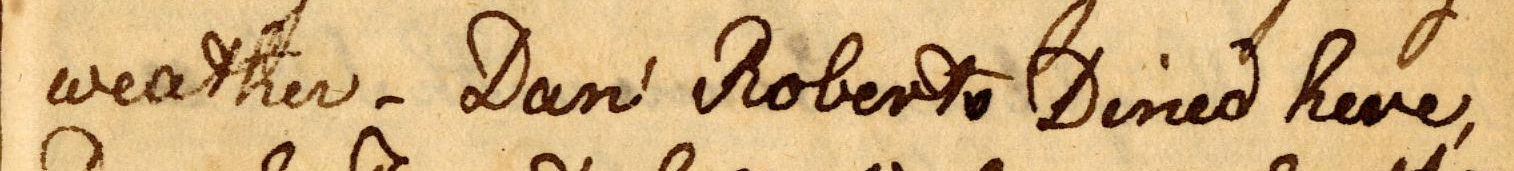weather- Dan Roberts Dined here,
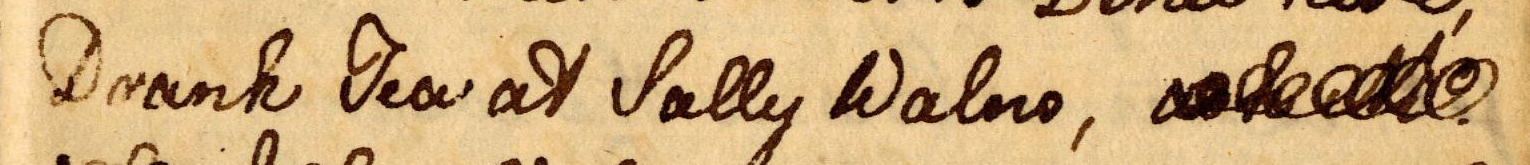Drank Tea at Sally Walns, [_____]
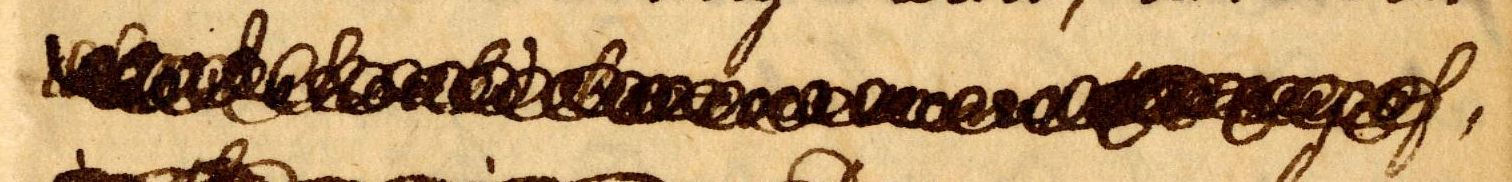[___________________________]
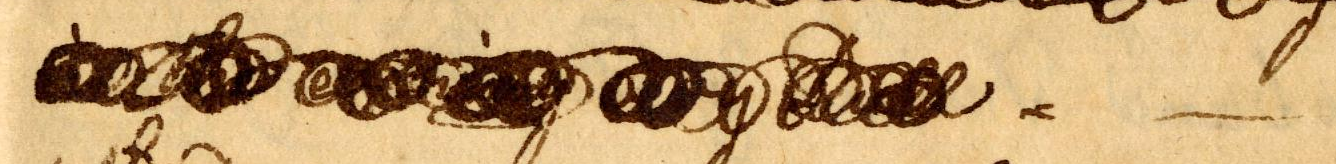[______________]-
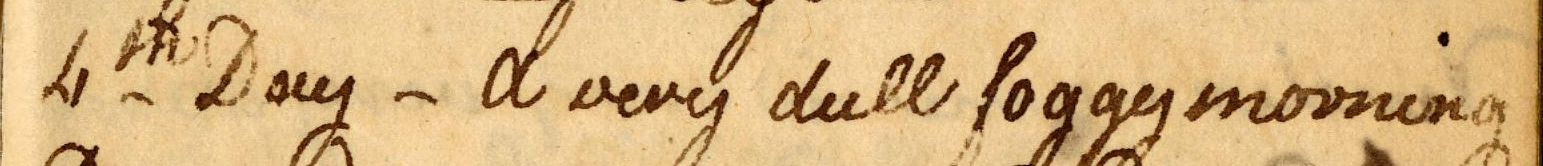4^th Day- A very dell foggy morning
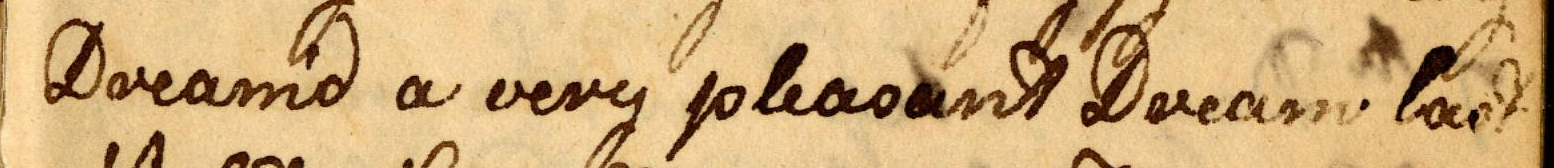Dream'd a very pleasant Dream last
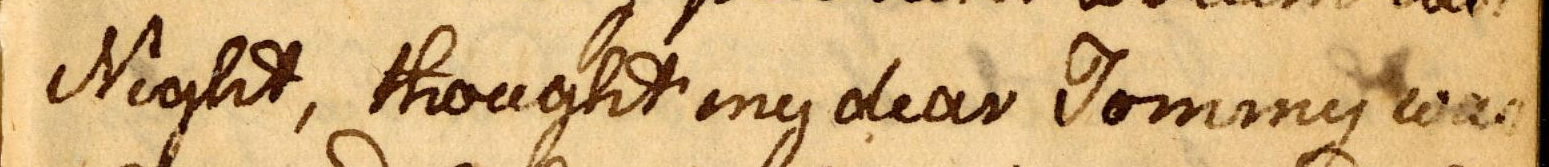Night, thought my dear Tommy was
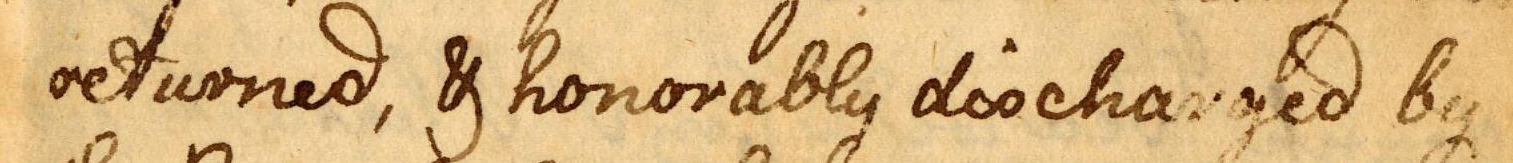returned, & honorably discharged by
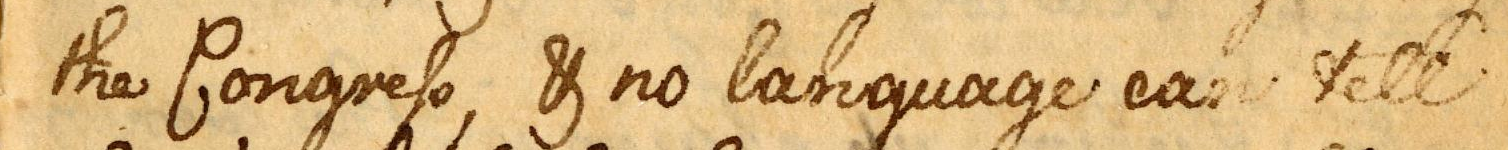the Congress, & no language can tell
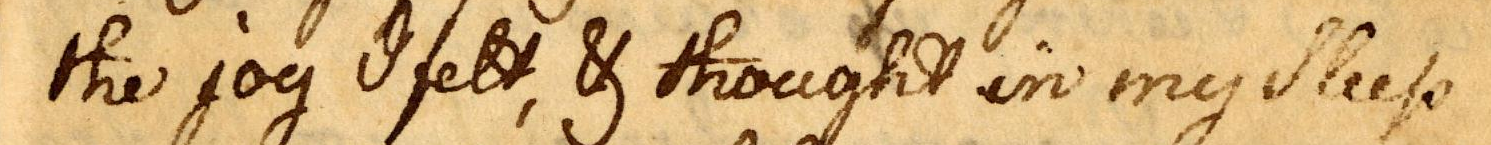the joy I felt & thought in my Sleep
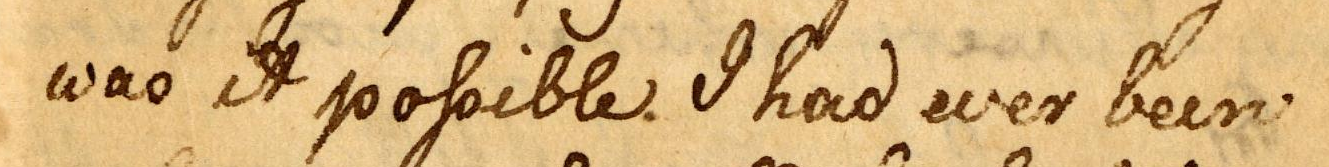was it possible. I had ever been
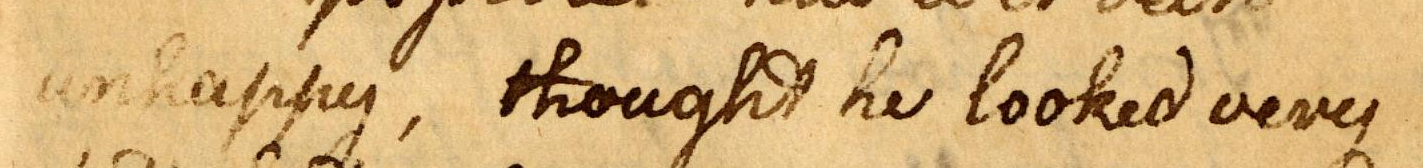unhappy, thought he looked very
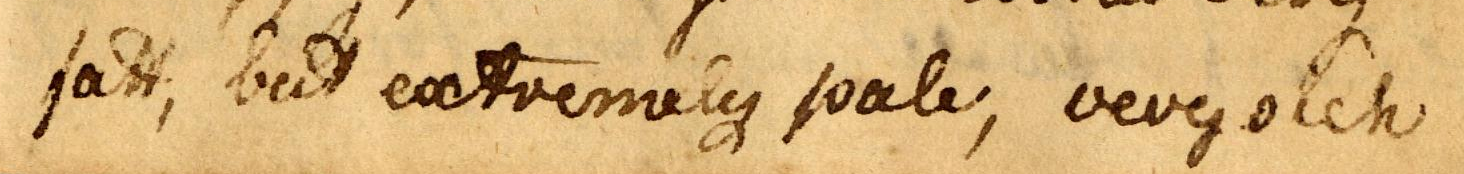fatt, but extremely pale, very sick
